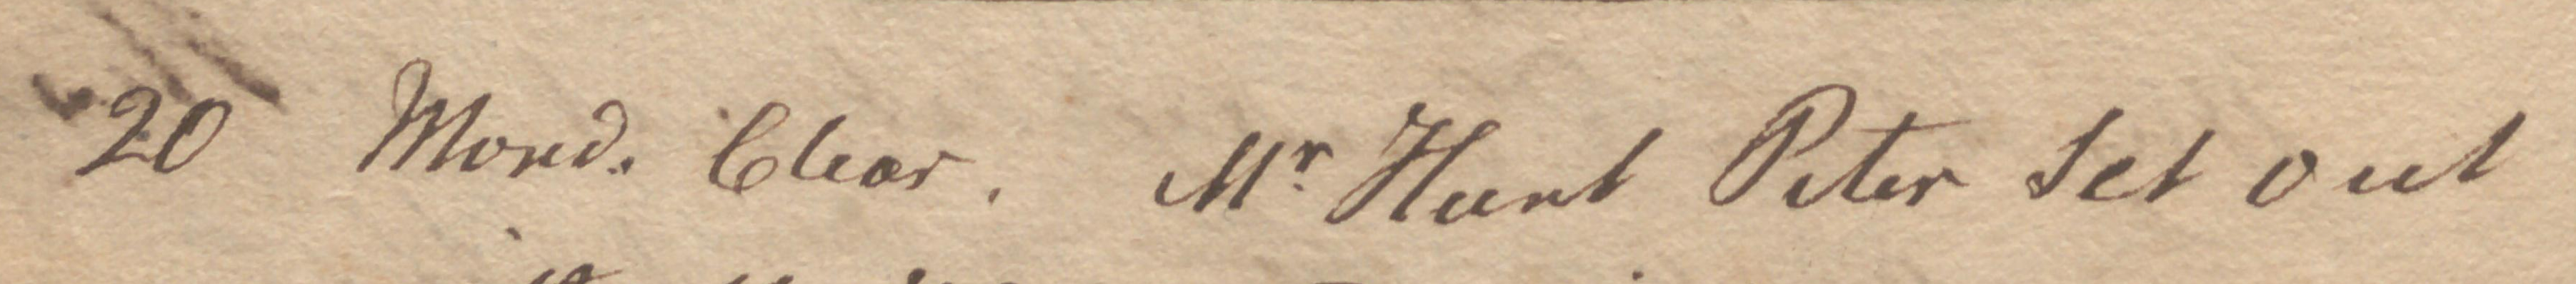20 Mond. Clear, M^r. Hunt Peter set out
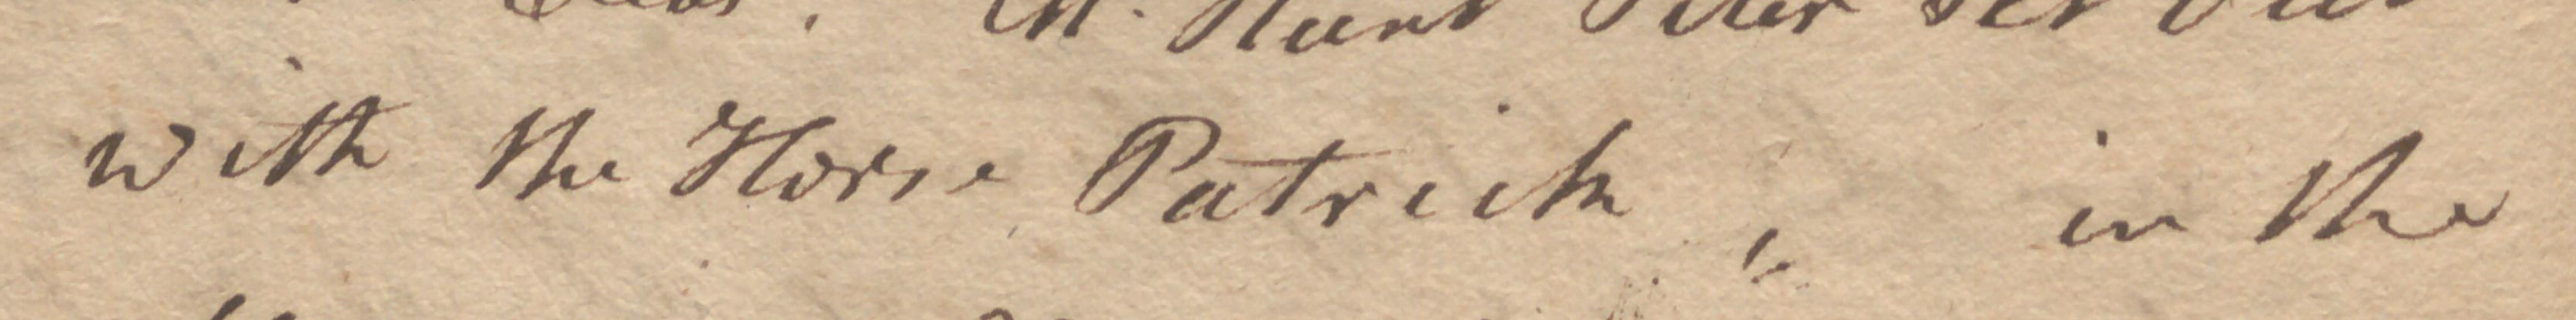with the Horse Patrick, in the
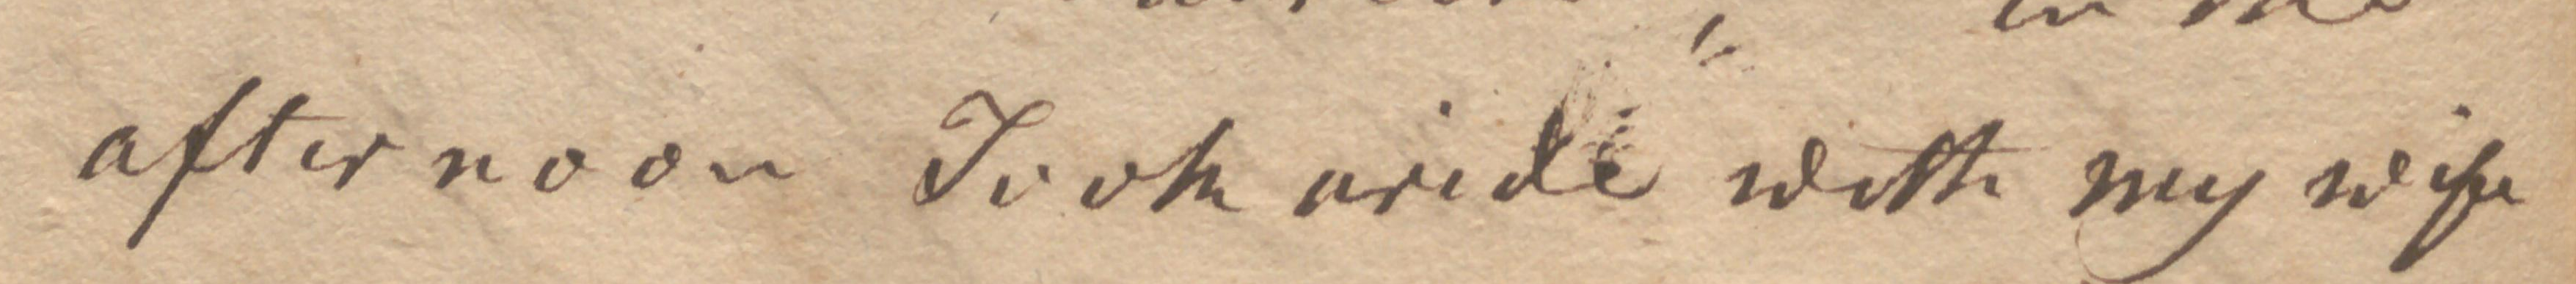afternoon Took a ride with my wife
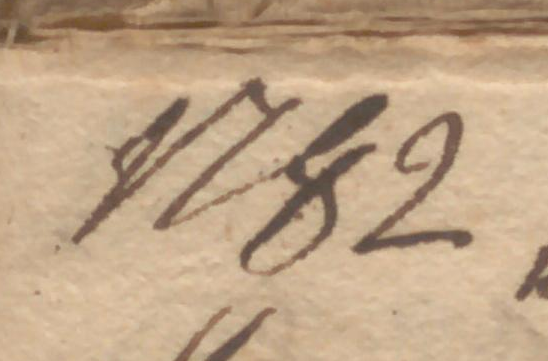1782
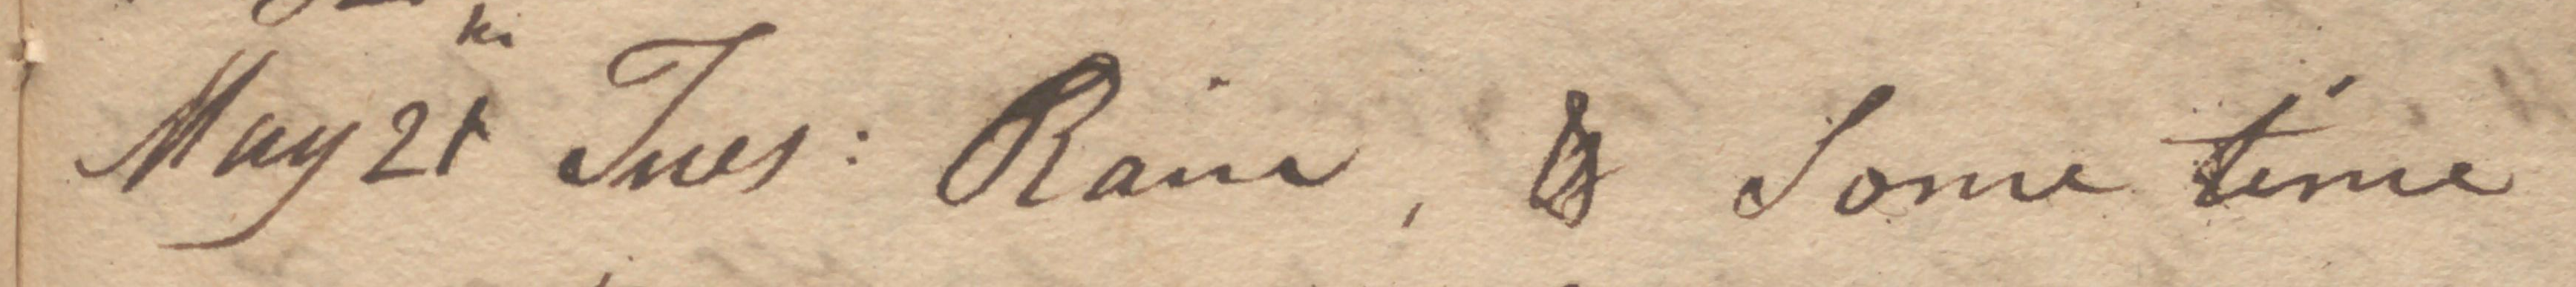May 21^th Tues: Rain, & some time
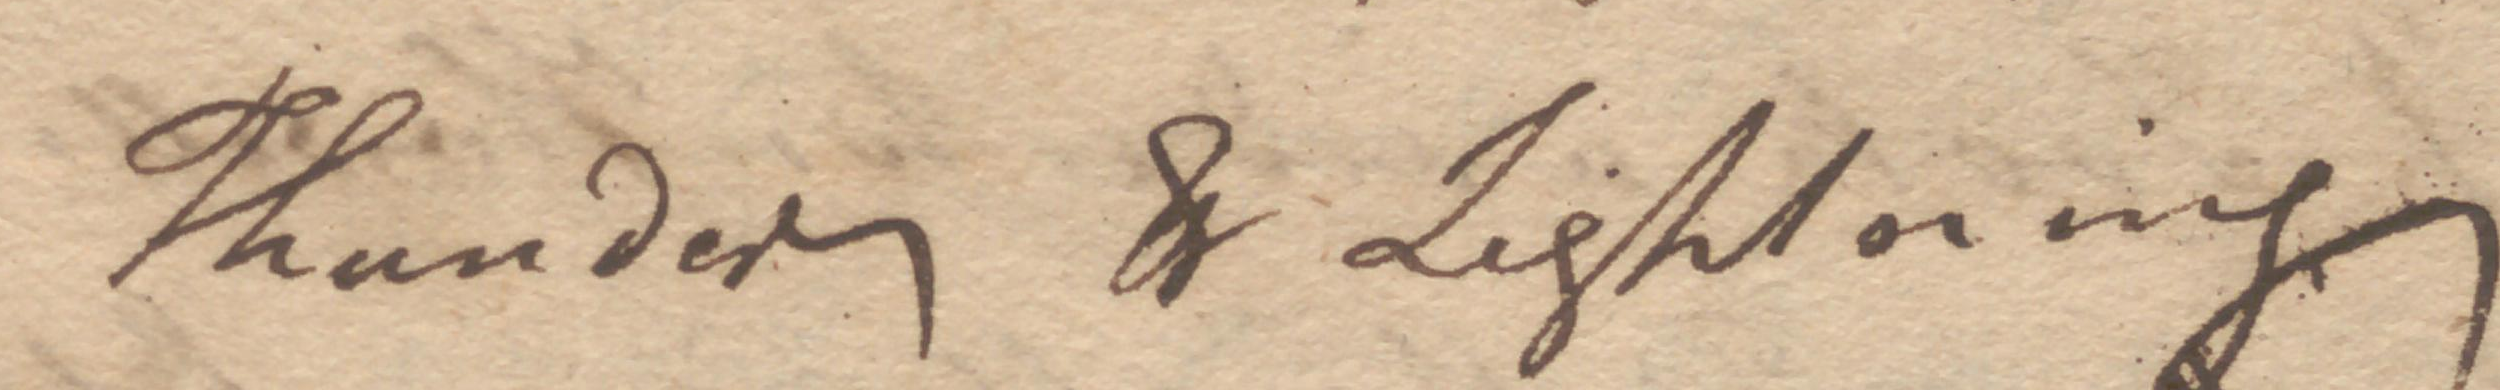Thunder & Lightning
